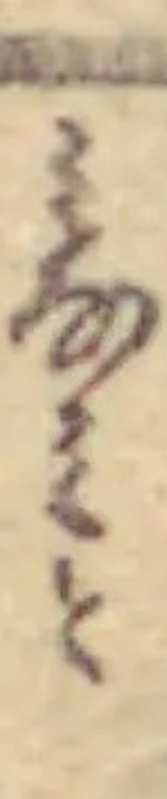みなみと
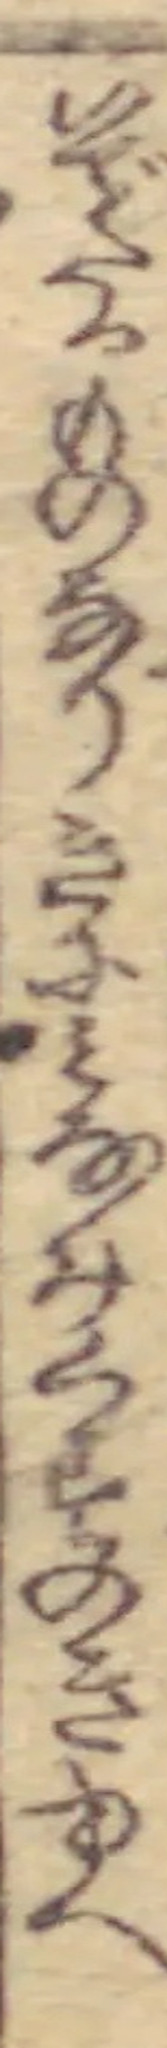いでたるものなりきにみなみくすのきゆへ
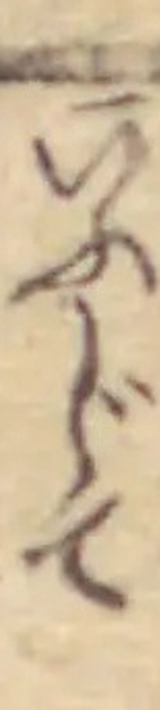いふじて
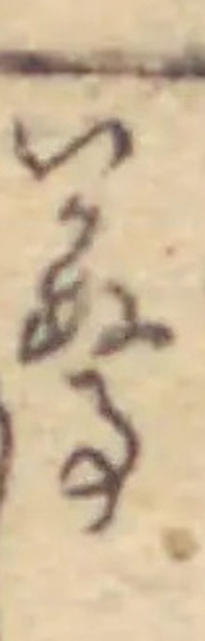いかぬ事
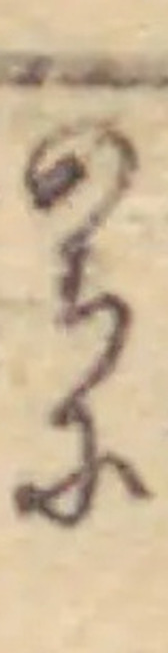のちに
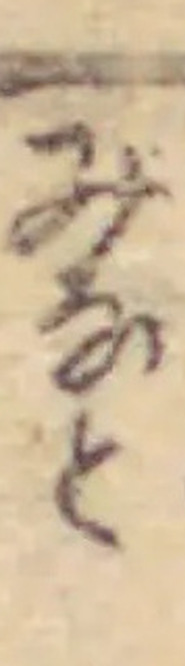みなと
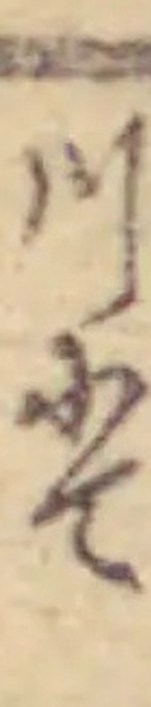川にて
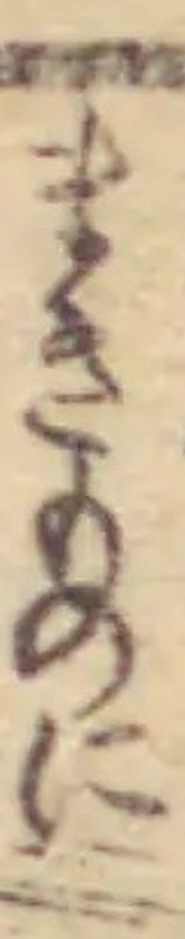まきものに
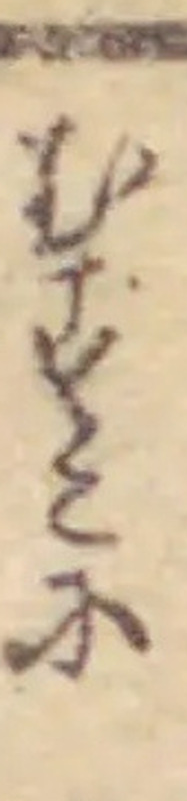むすこに
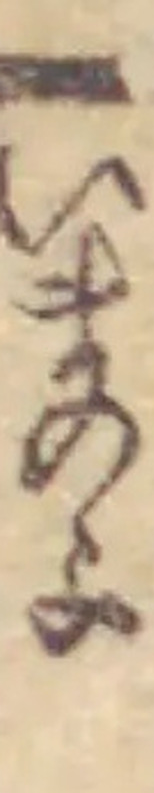いまのよ
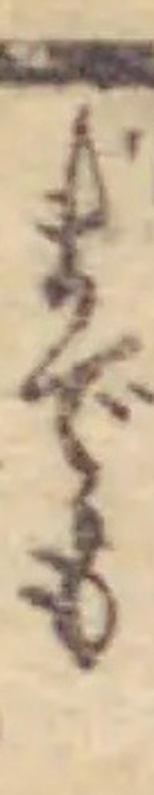までも
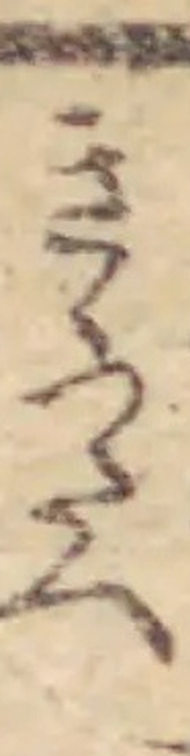きゝつたへ
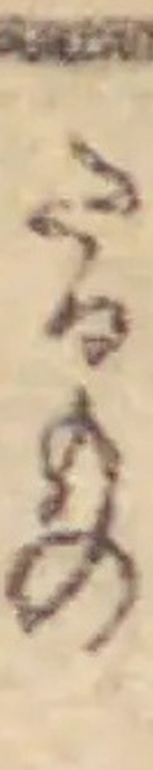たるもの
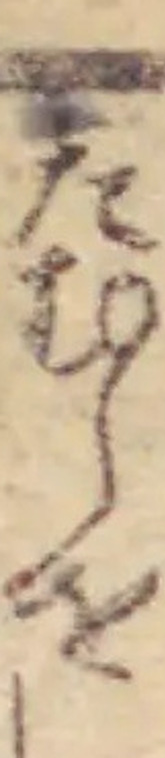たむしを
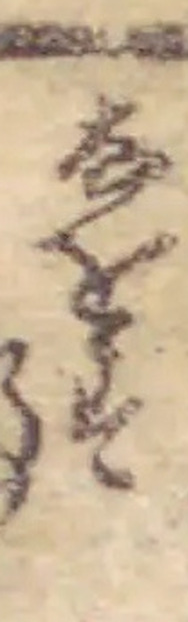なをす
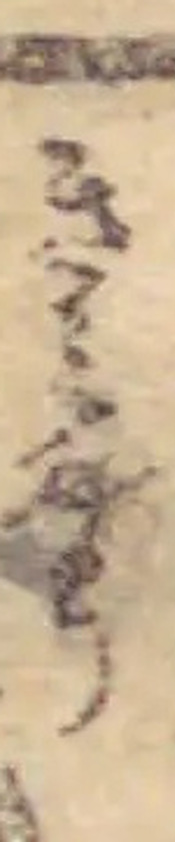きみやう
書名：家伝寿命薬 2巻
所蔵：国立国会図書館 National Diet Library, JAPAN
